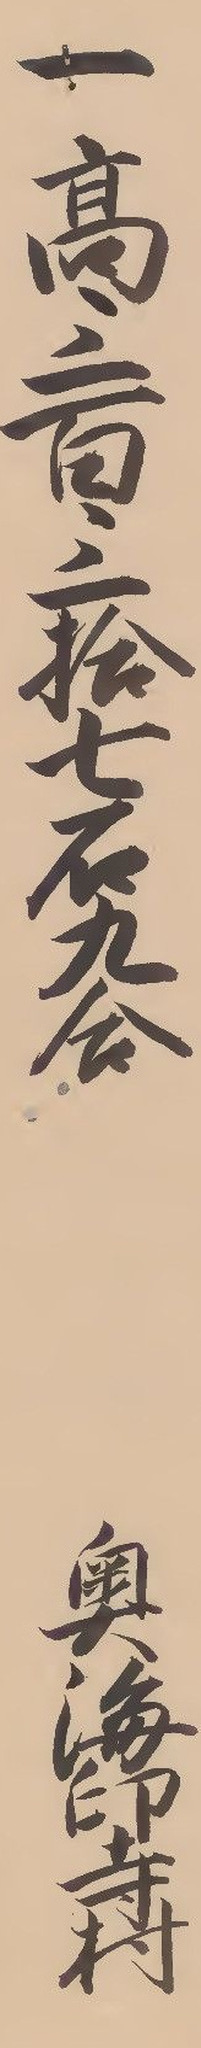一高三百三拾七石九合奥海印寺村

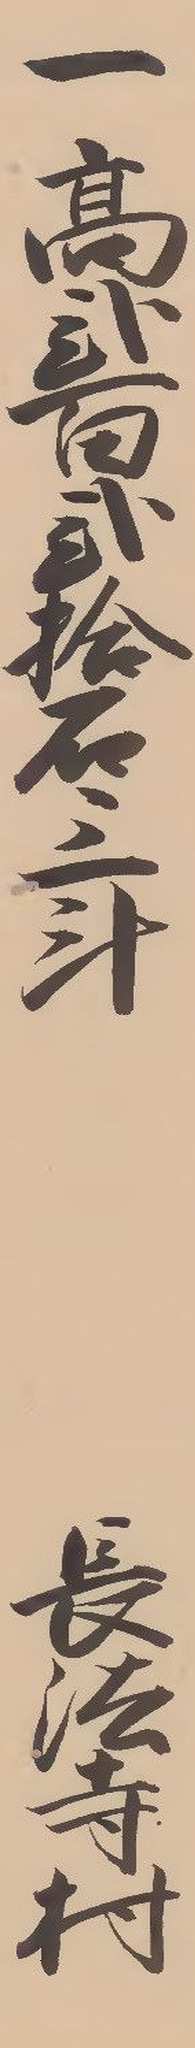一高弐百弐拾石三斗長法寺村
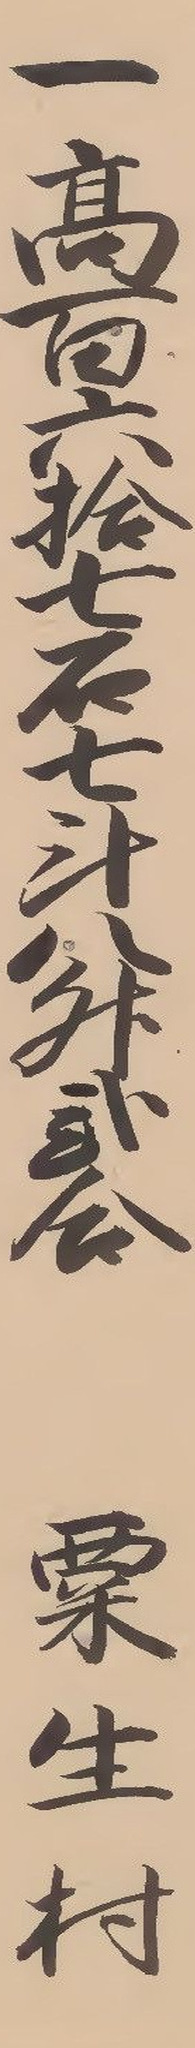一高百六拾七石七斗八升弐合粟生村
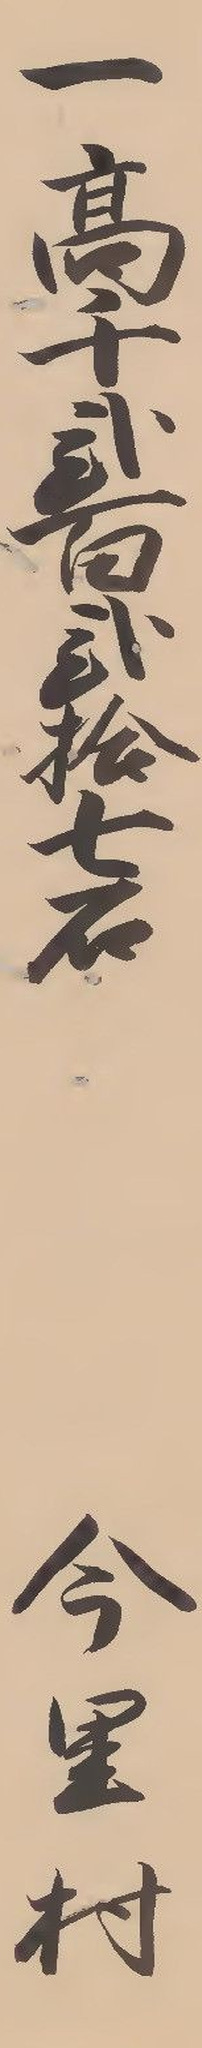一高千弐百弐拾七石今里村
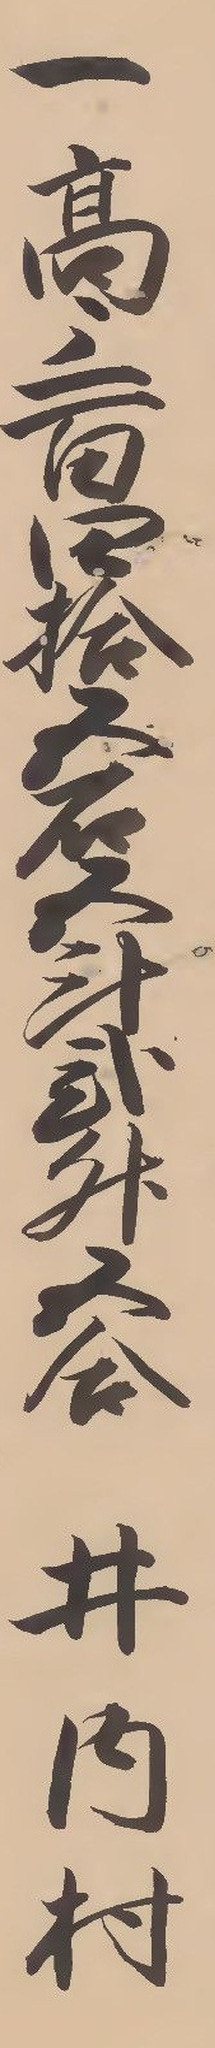一高三百四拾五石五斗弐升五合井内村
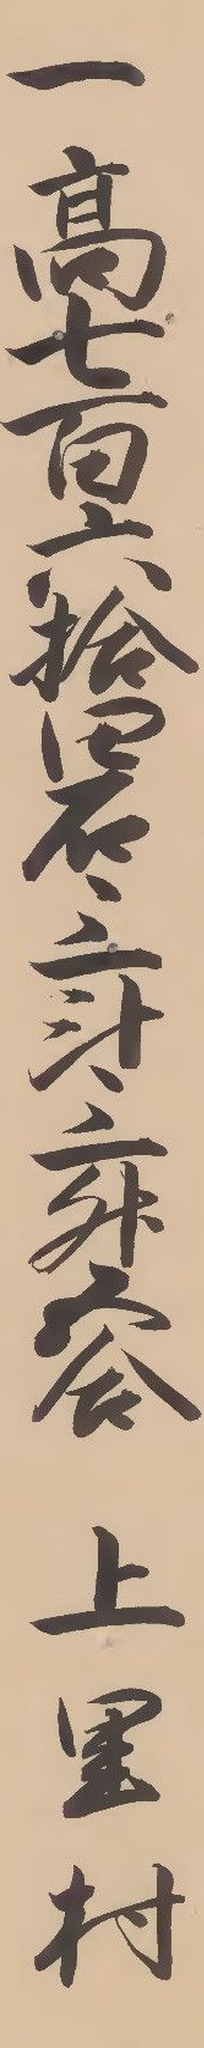一高七百六拾四石三斗三升五合上里村
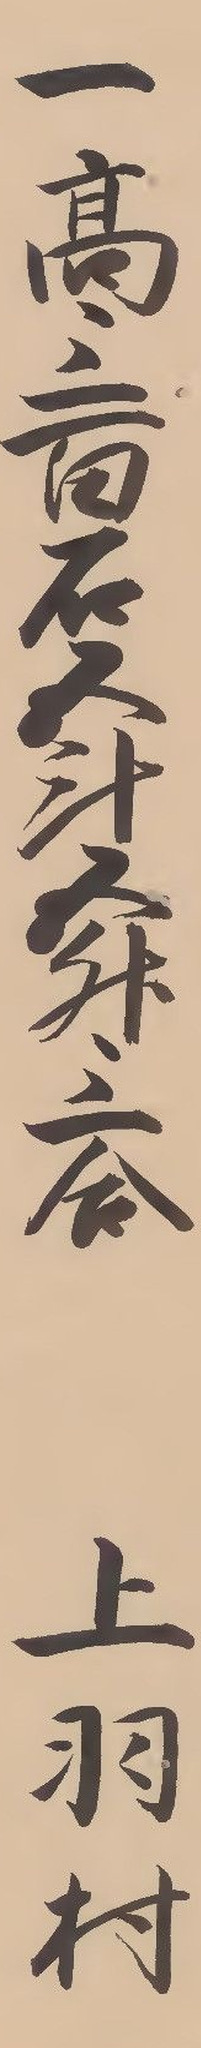一高三百石五斗五升三合上羽村
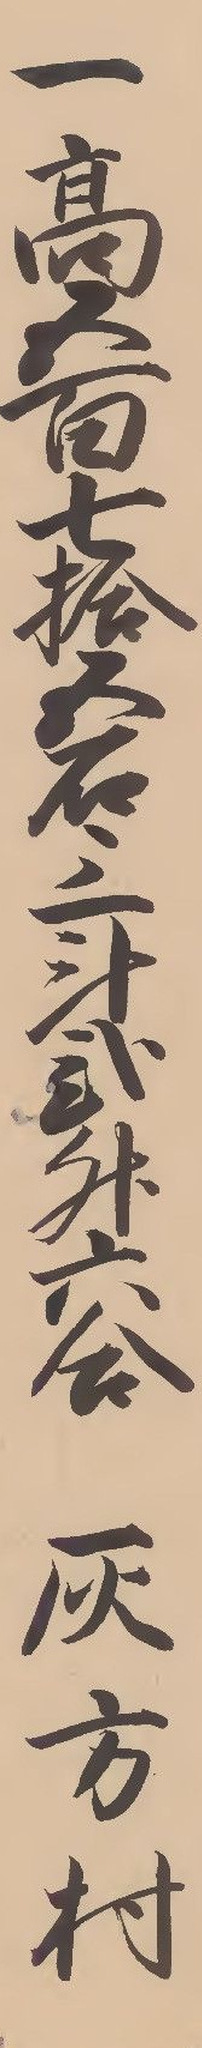一高五百七拾五石三斗弐升六合灰方村

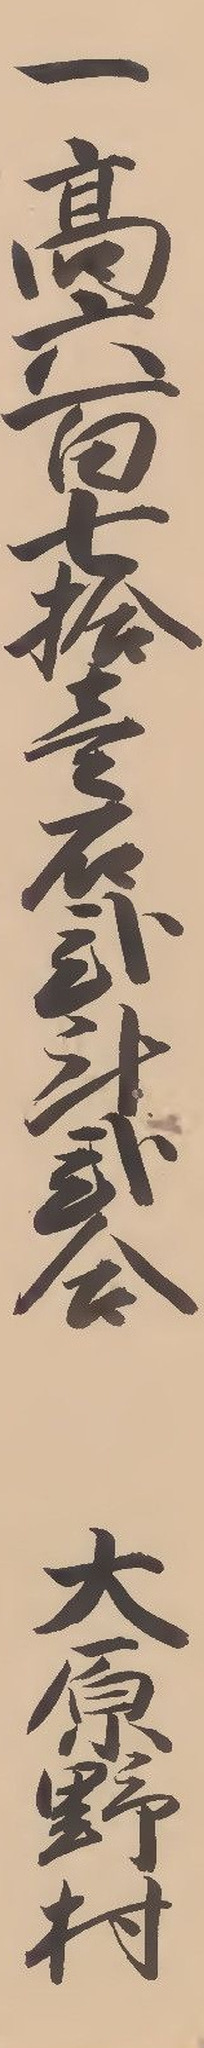一高六百七拾壱石弐斗弐合大原野村
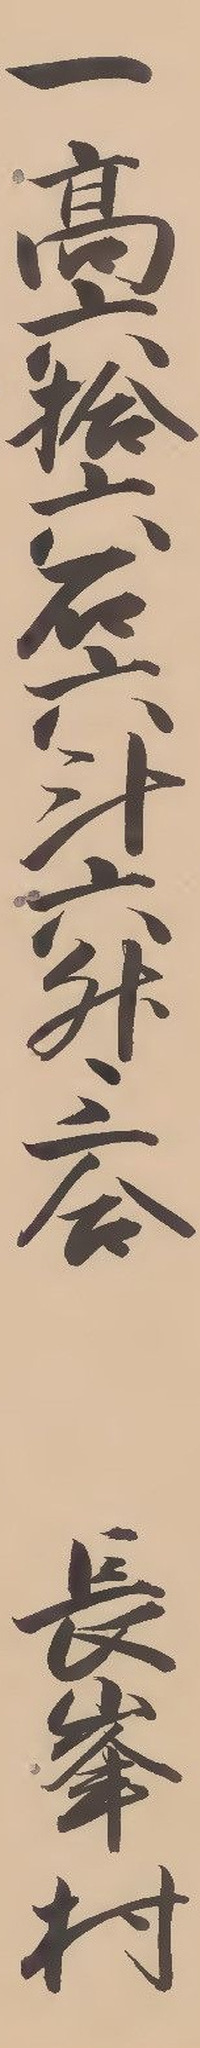一高六拾六石六斗六升三合長峰村
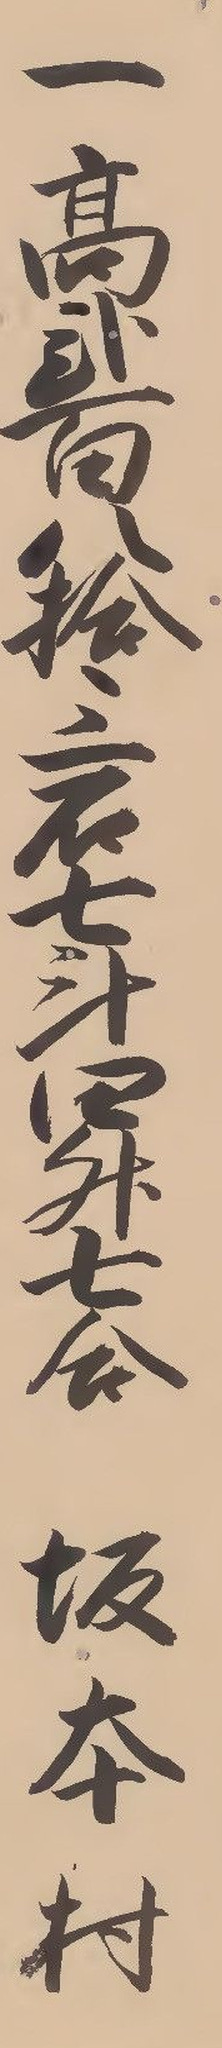一高弐百八拾三石七斗四升七合坂本村
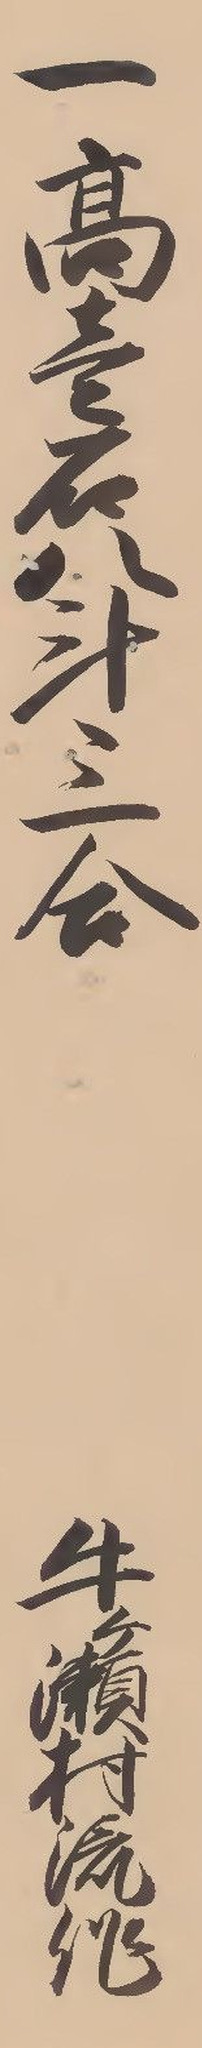一高壱石八斗三合牛ヶ瀬村流作
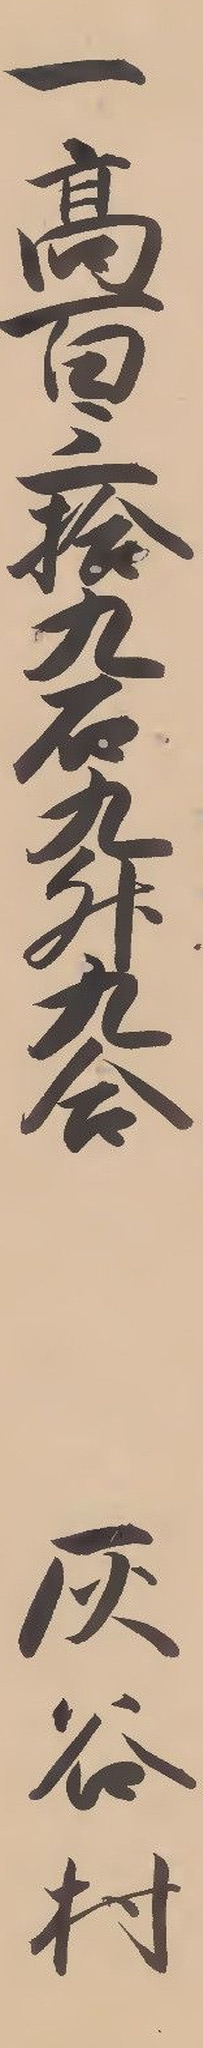一高百三拾九石九升九合灰谷村
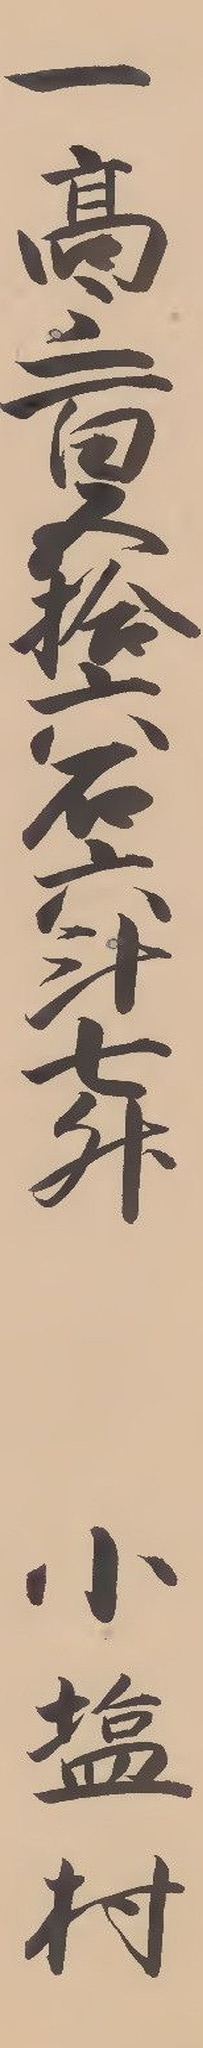一高三百五拾六石六斗七升小塩村
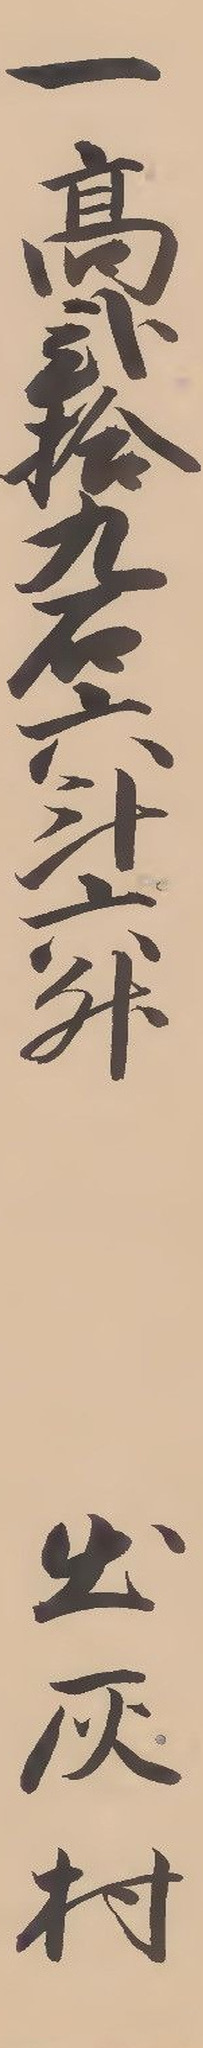一高弐拾九石六斗六升出灰村
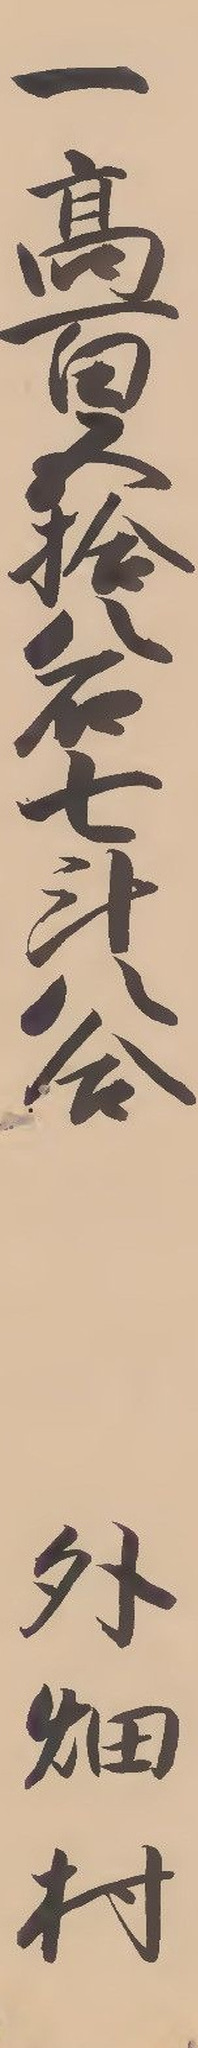一高百五拾八石七斗八合外畑村
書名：山城国郷帳
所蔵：国立公文書館 National Archives of Japan
